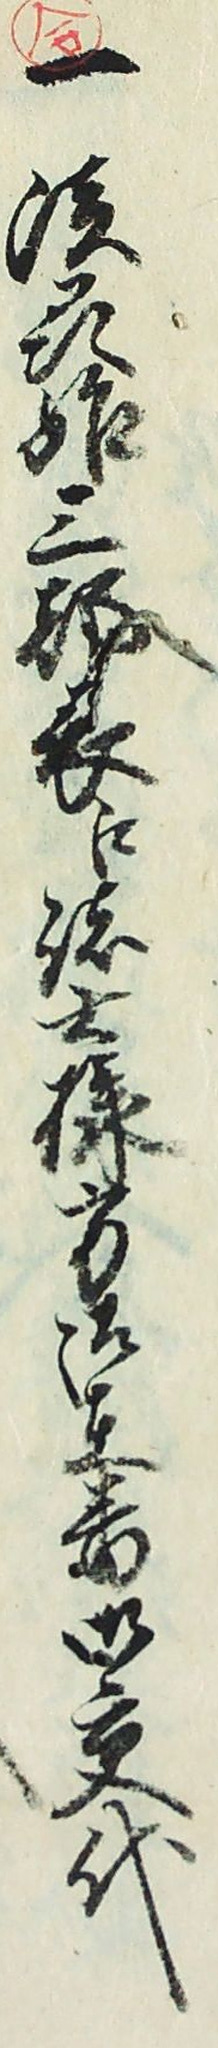一淡州始三郡表え諸士様方御在番御交代
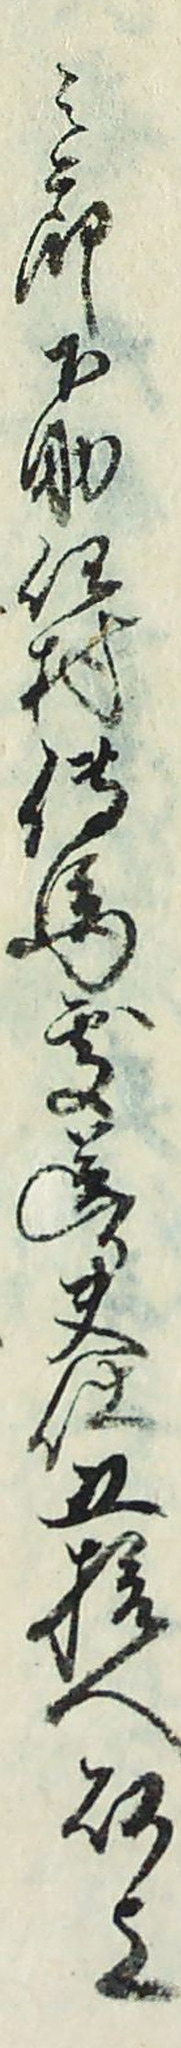の節下助任村伝馬処送り夫仕五十人以上
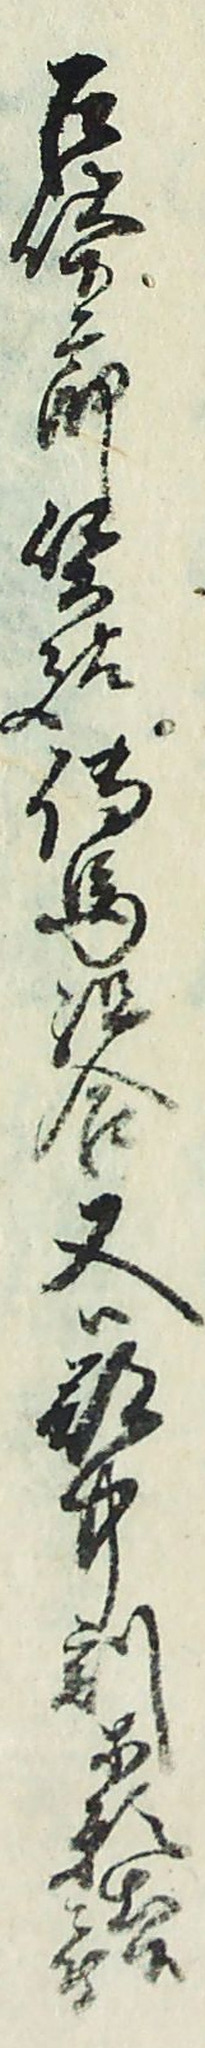召仕候節賃銀伝馬組合又は郡中割等願出候に付
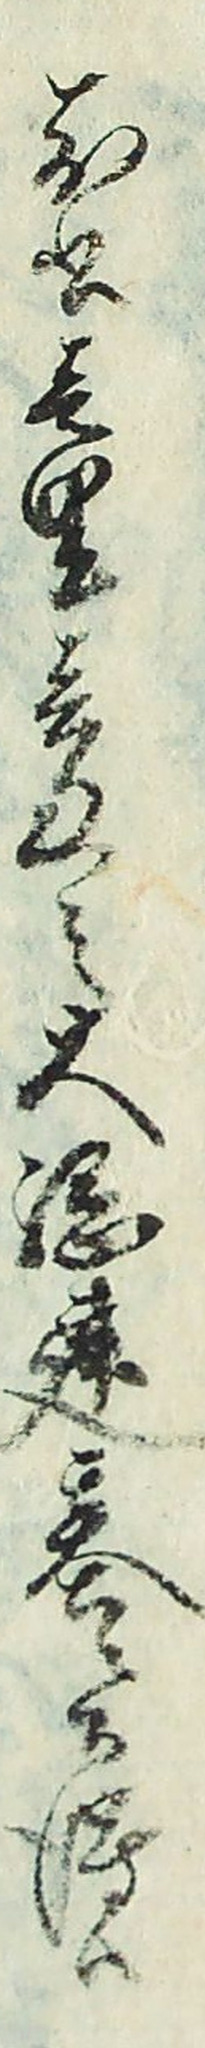前書一里一匁の大綱建基に候得は
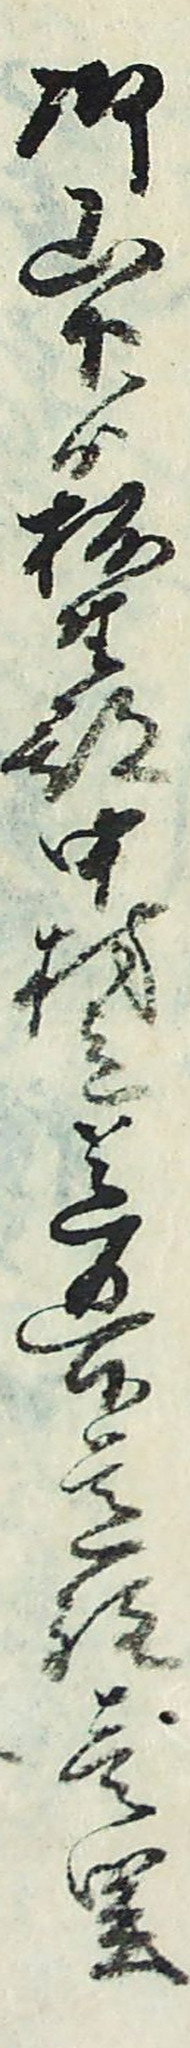御山下より板野郡中村迄送込候道程一里
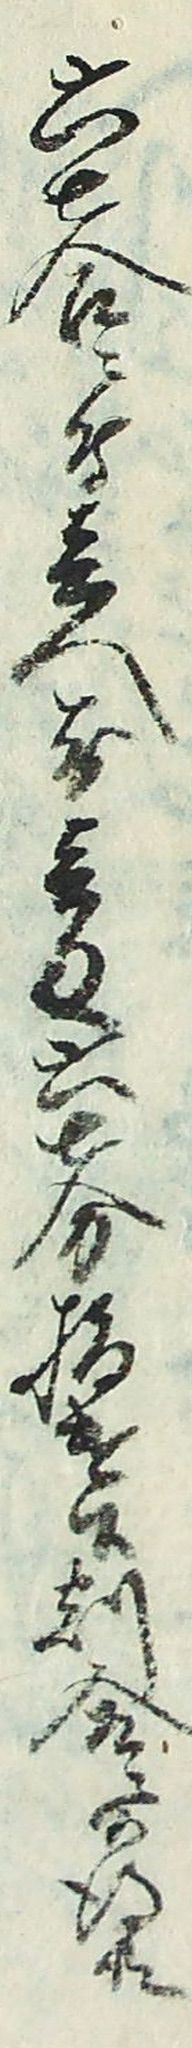六七合に付一人前一匁六七分指遣候割合に候得共
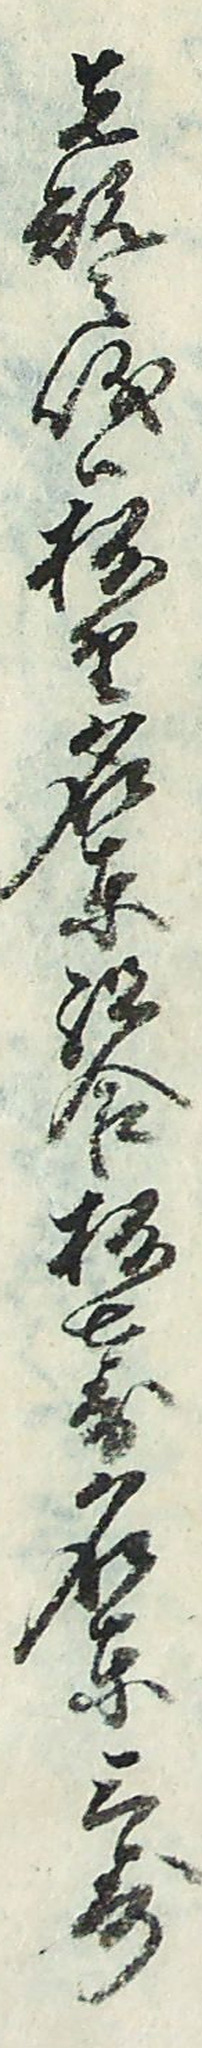先規の儀は板野名東組合板七歩名東三歩

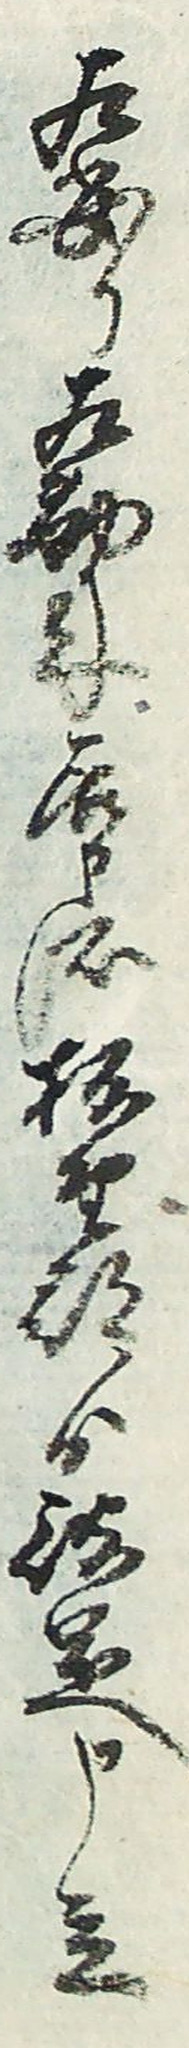相当り相勤来居申所板野郡より彼是申立
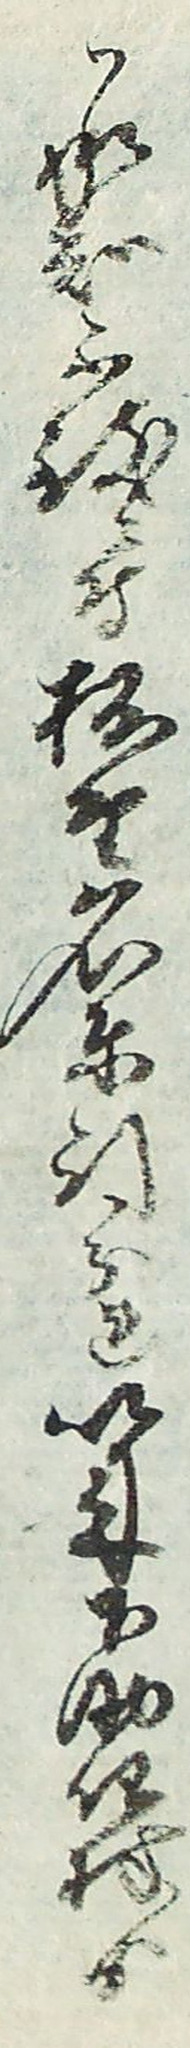承知不致に付板野名東引分れ以来下助任村より
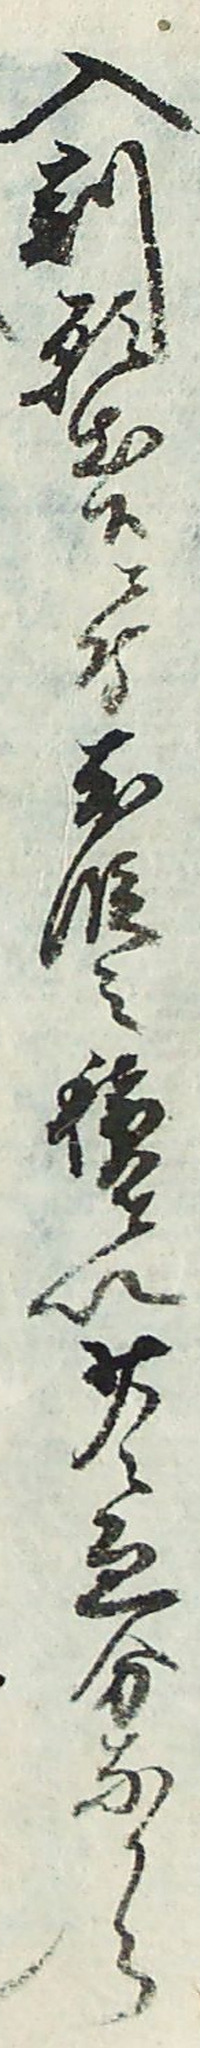入割願出候に付別段の積を以少々過分なから
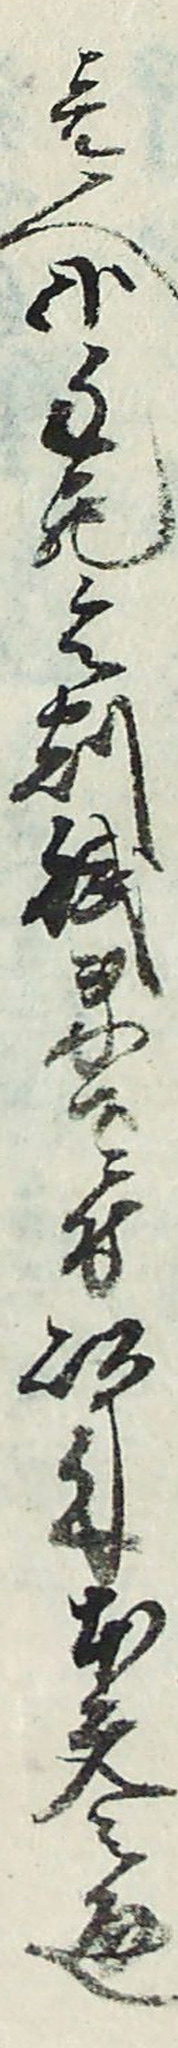一人匁宛にて割賦来候に付以来本文の通
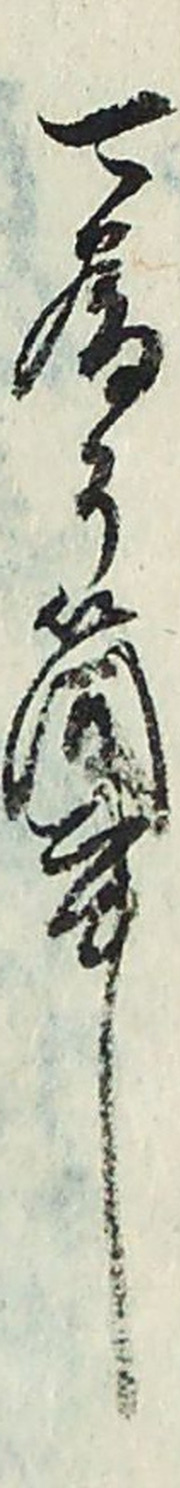可為了簡事
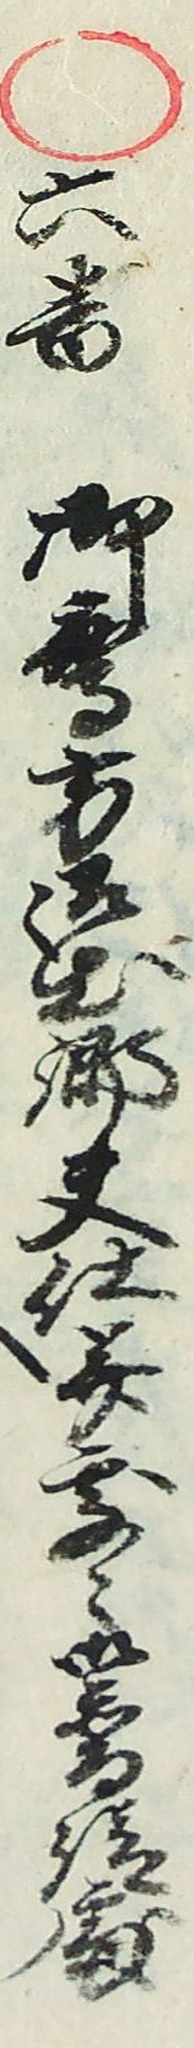六番御鷹方御出郷夫仕幷処々御普請処
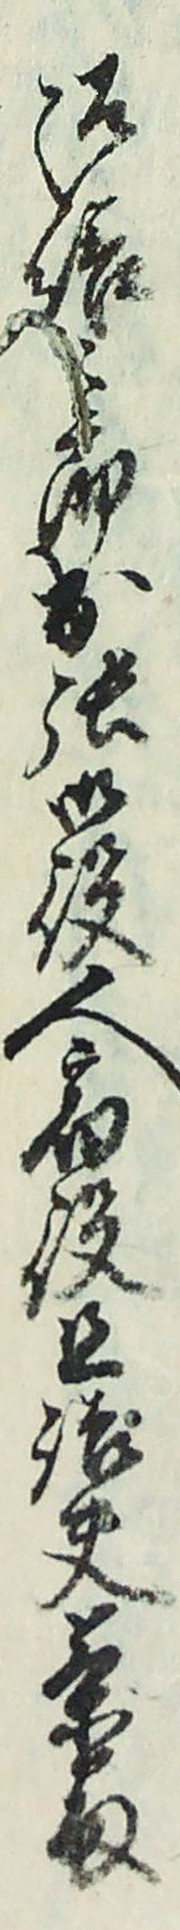御繕の節出張御役人宿役且詰夫茶番
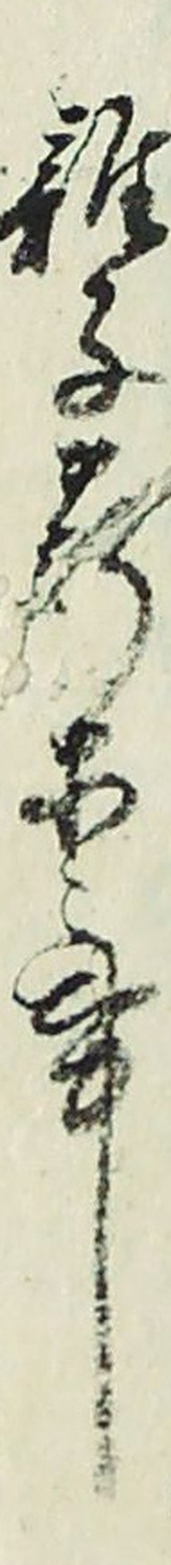雑子薪等の事
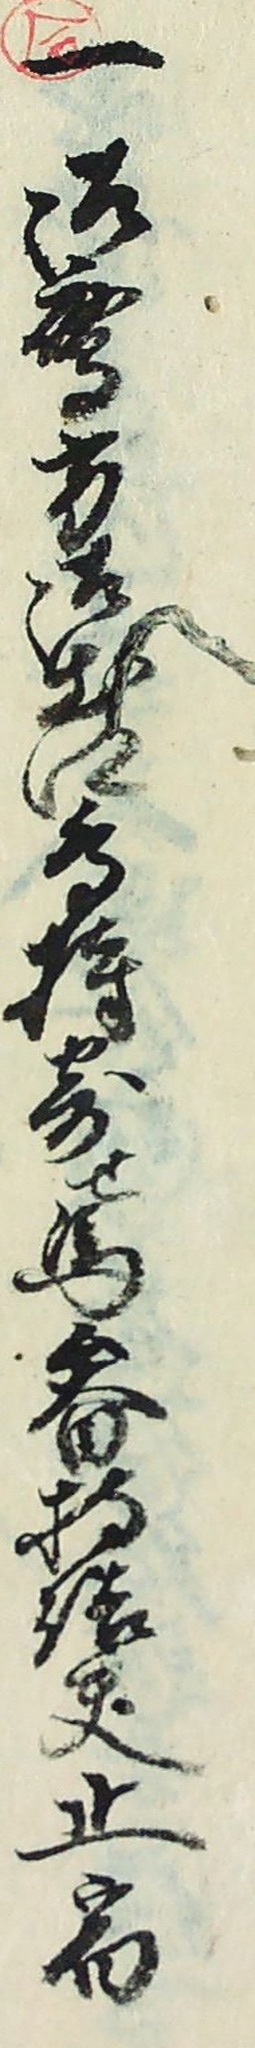一御鷹方御出郷鳥持寄せ馬畚持詰夫止宿
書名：諸割賦物賃銀定記録帳
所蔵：鳴門教育大学 Naruto University of Education
